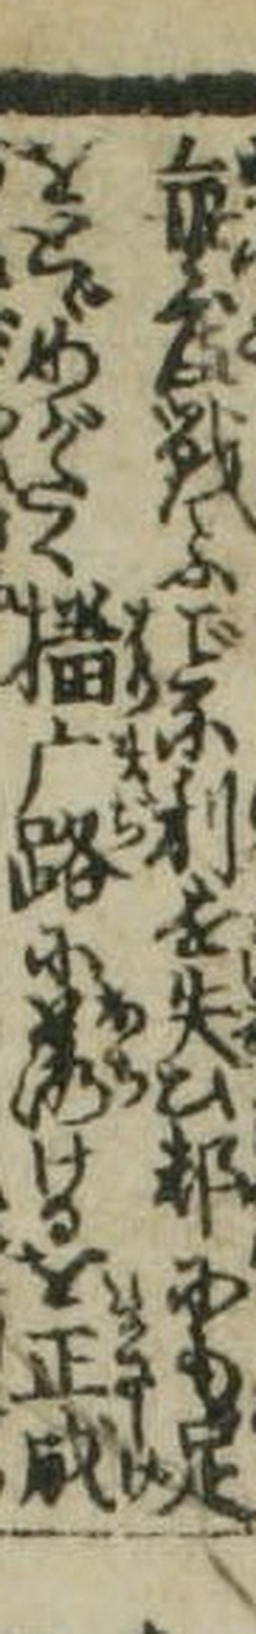をとゞめがたく播磨路に落けるを正成
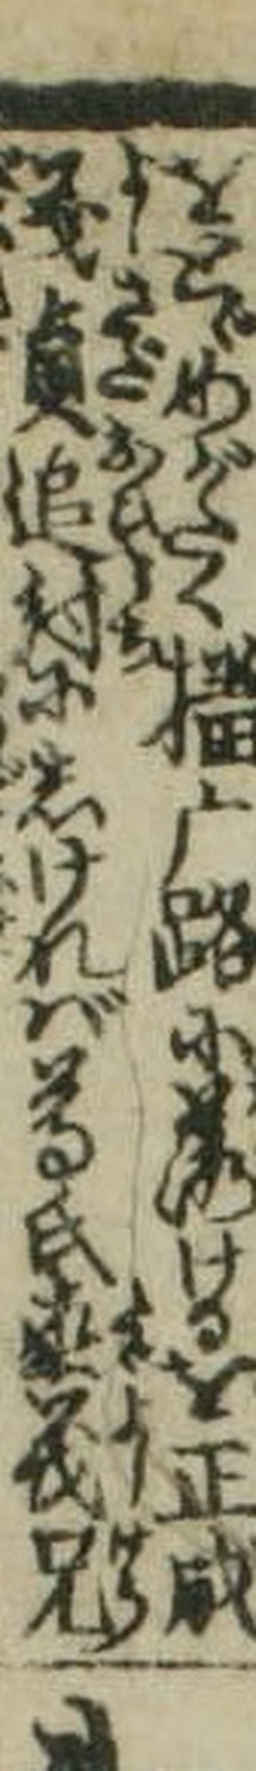義貞追討にしければ尊氏直義兄
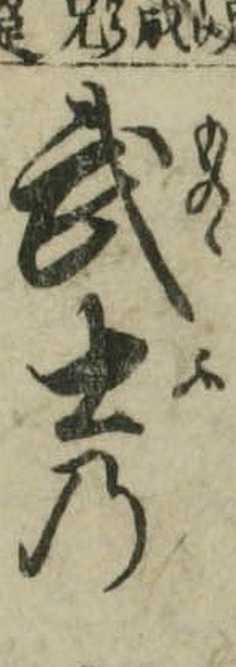武士の
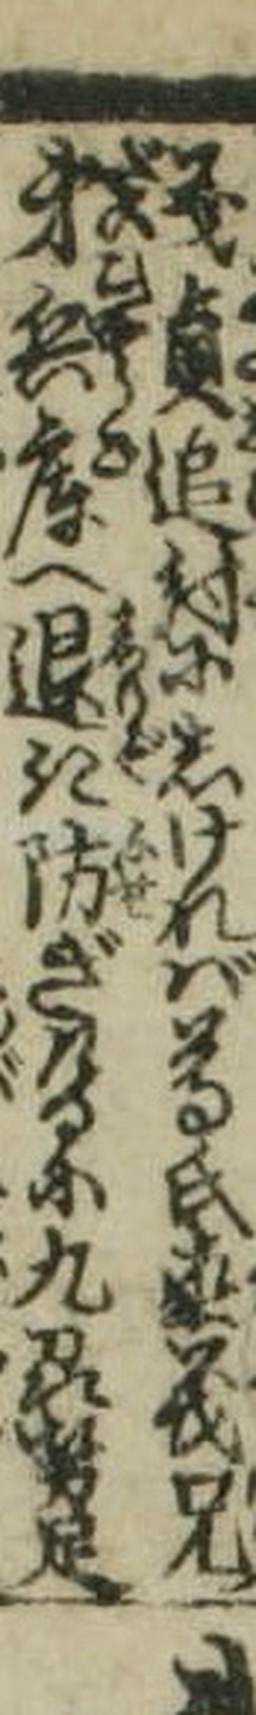弟兵庫へ退き防ぎけるに九州勢足
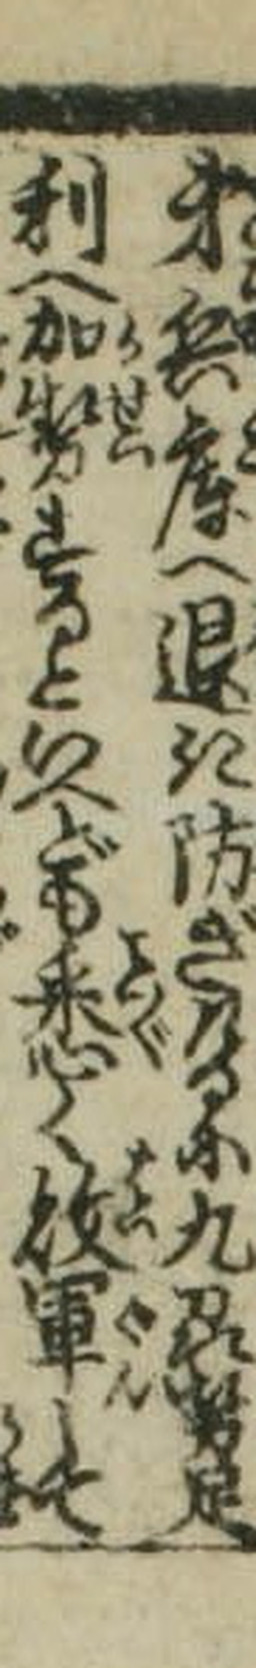利へ加勢するといへども悉く敗軍して
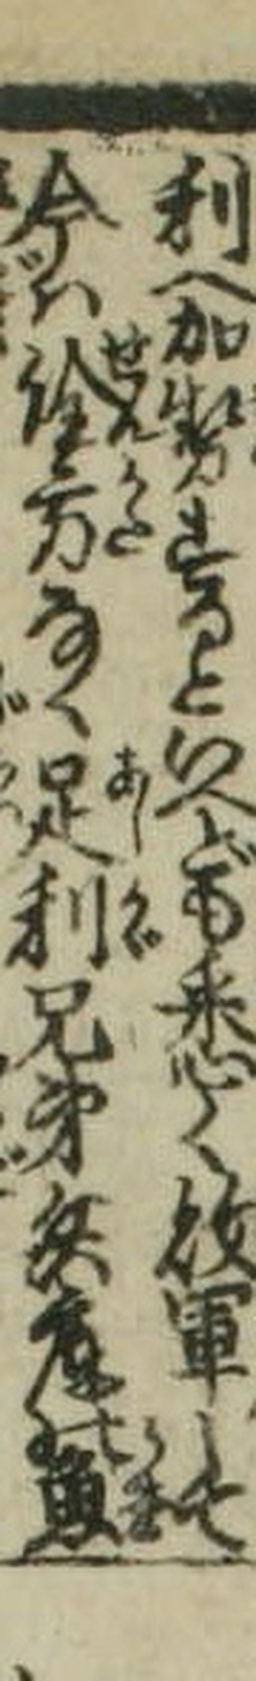今は詮方なく足利兄弟兵庫の魚
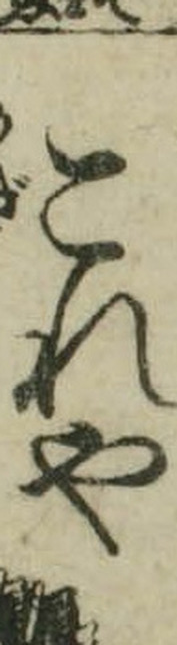これや
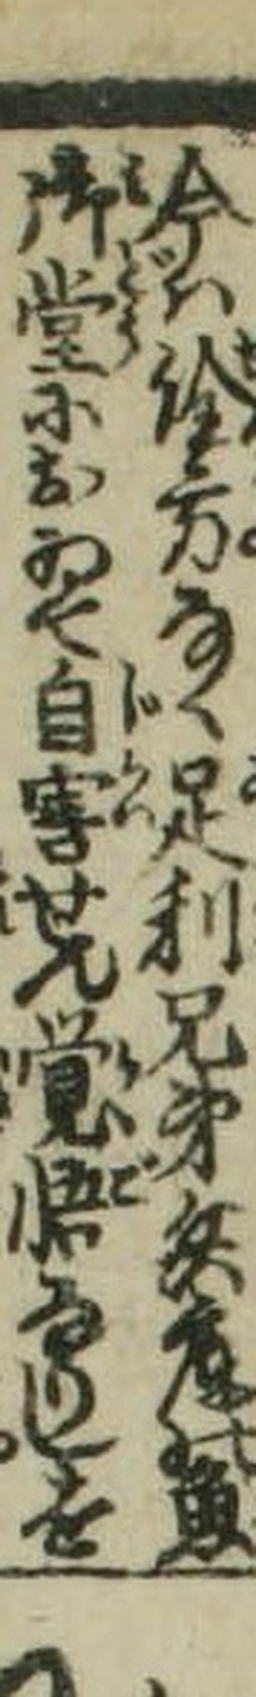御堂におゐて自害せん覚悟なりしを
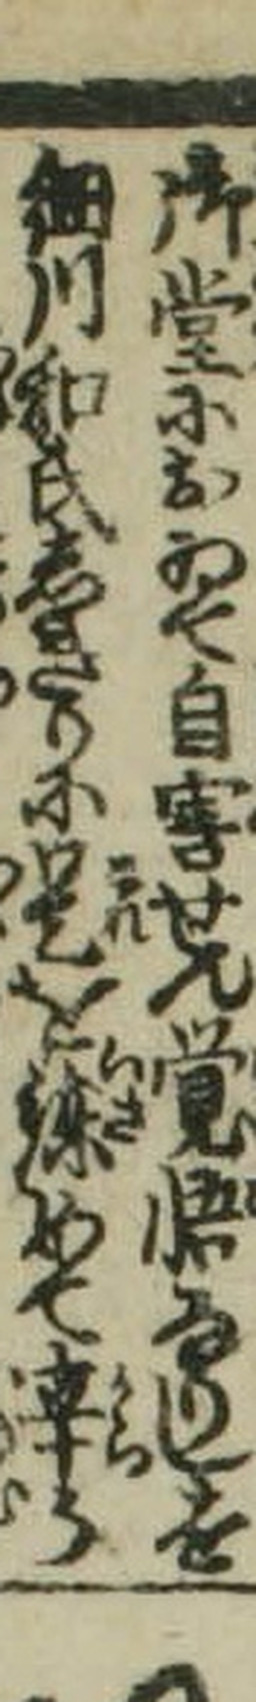細川和氏しきりに是を諫めて辛う
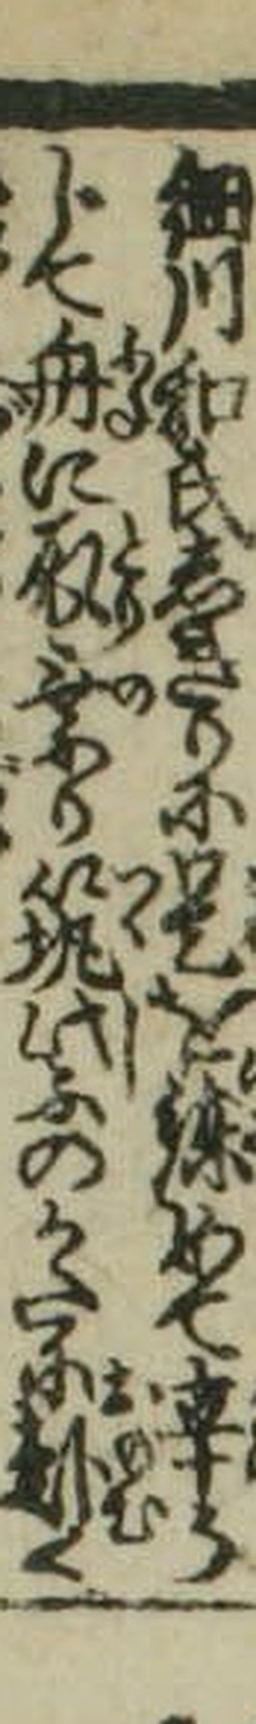じて舟に取乗り筑紫のかたに赴く
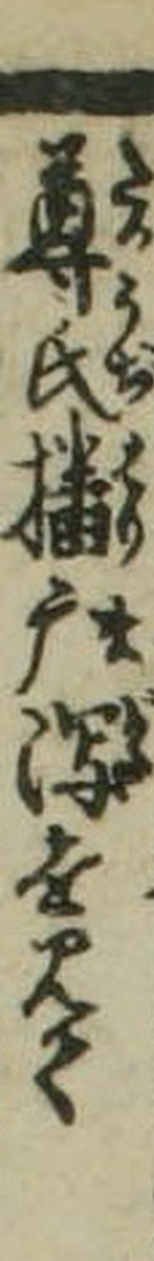尊氏播磨潟を見て
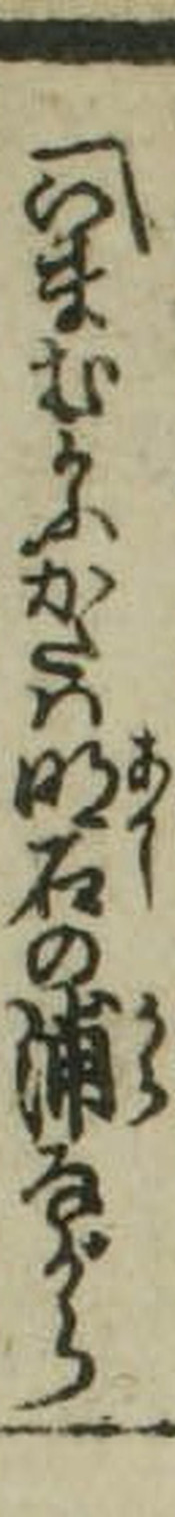〽いまむかふかたは明石の浦ながら
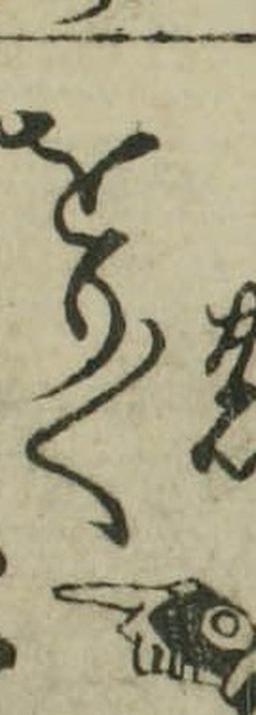をり〳〵
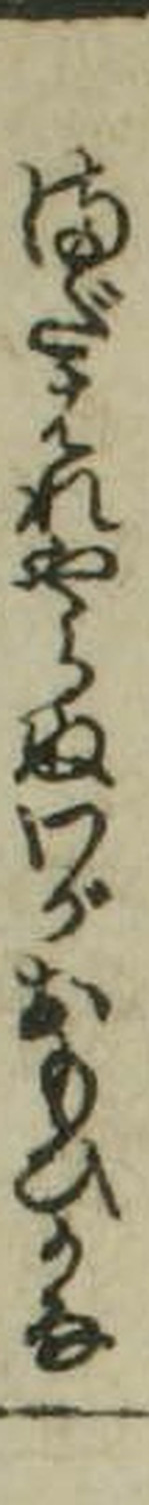まだはれやらぬわがおもひかな
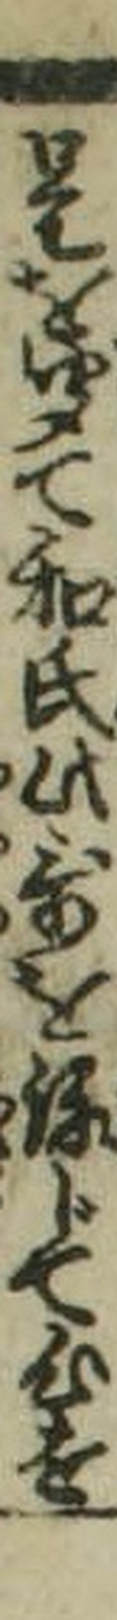是を聞て和氏此哥を詠じて心を
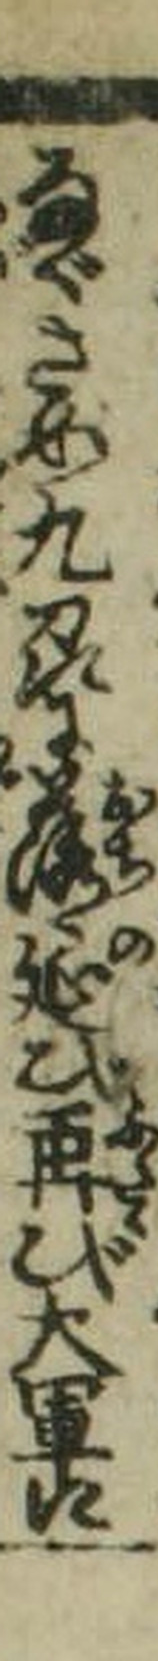なぐさめ九州に落延び再び大軍に
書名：續英雄百人一首
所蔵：東京学芸大学附属図書館
